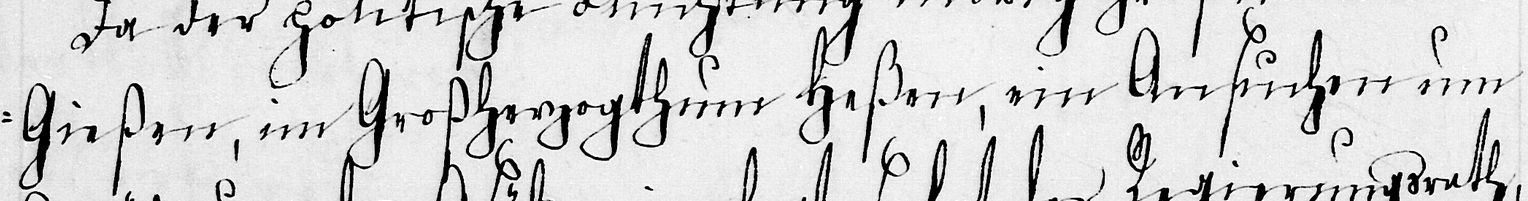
Gießen, im Großherzogthum Heßen, ein Ansuchen um
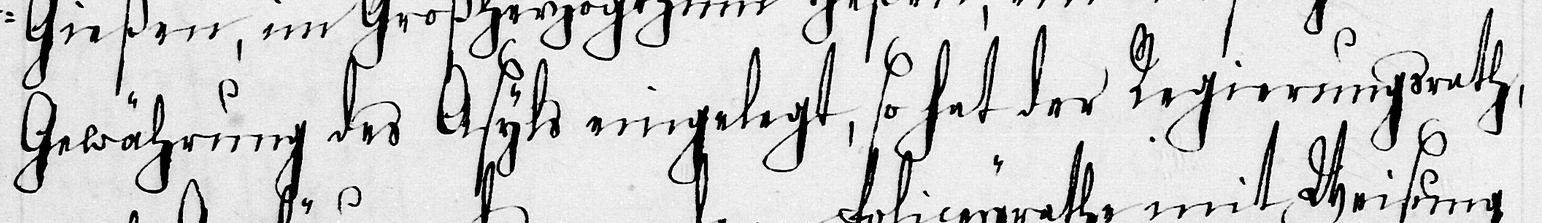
Gewährung des Asyls eingelegt, so hat der Regierungsrath,
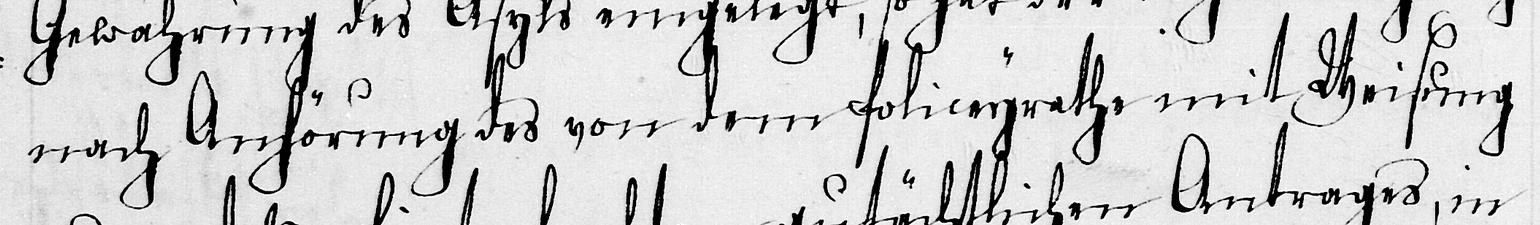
nach Anhörung des von dem Policeyrathe mit Weisung
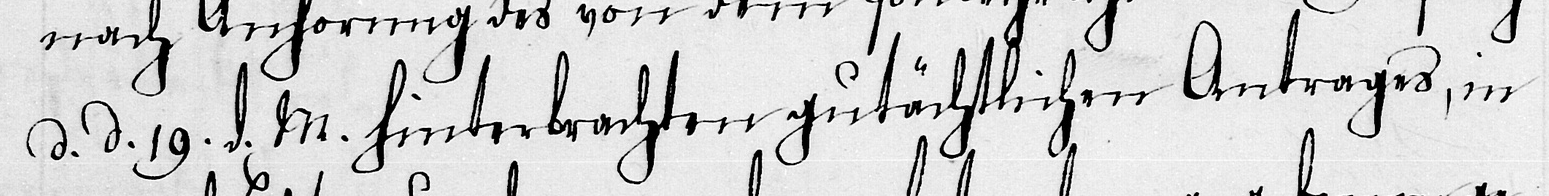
d. d. 19. d. M. hinterbrachten gutächtlichen Antrages, in
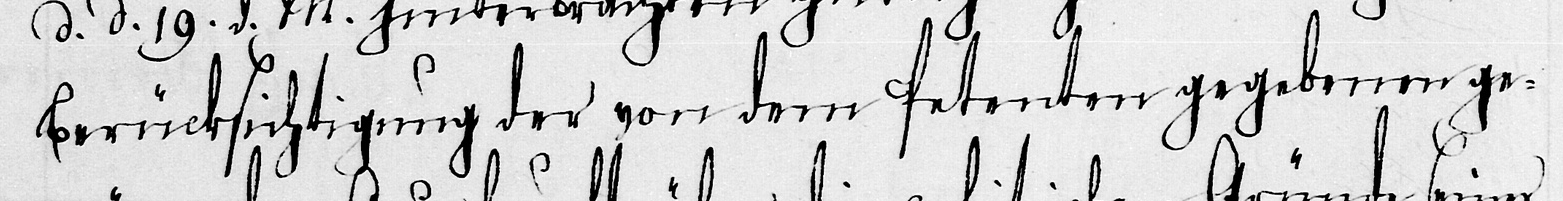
Berücksichtigung der von dem Petenten gegebenen ge¬
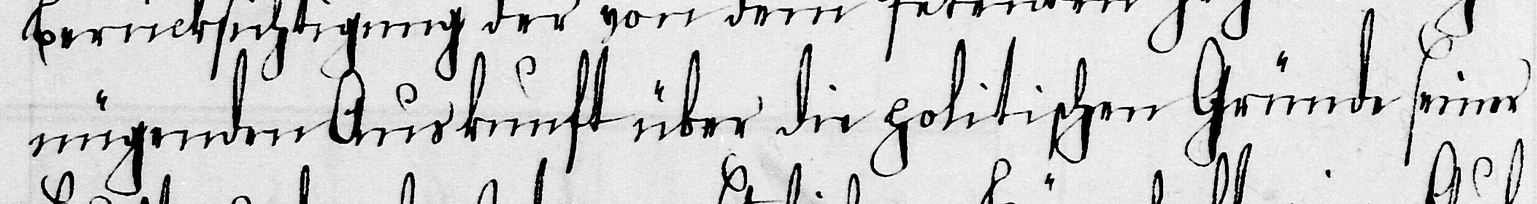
nügenden Auskunft über die politischen Gründe seiner
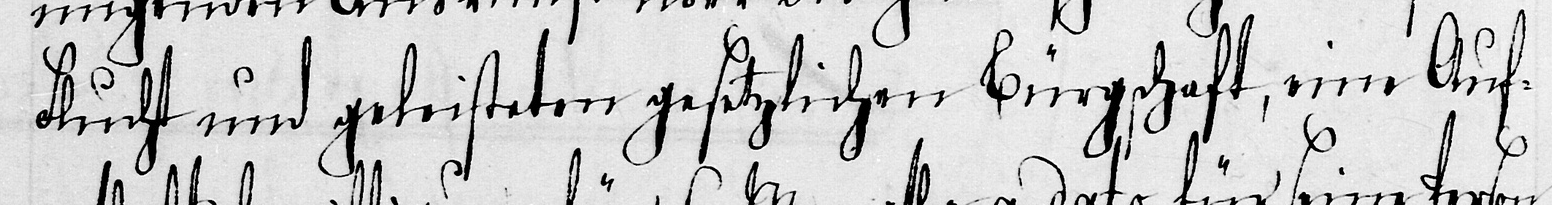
Flucht und geleisteten gesetzlichen Bürgschaft, eine Auf¬
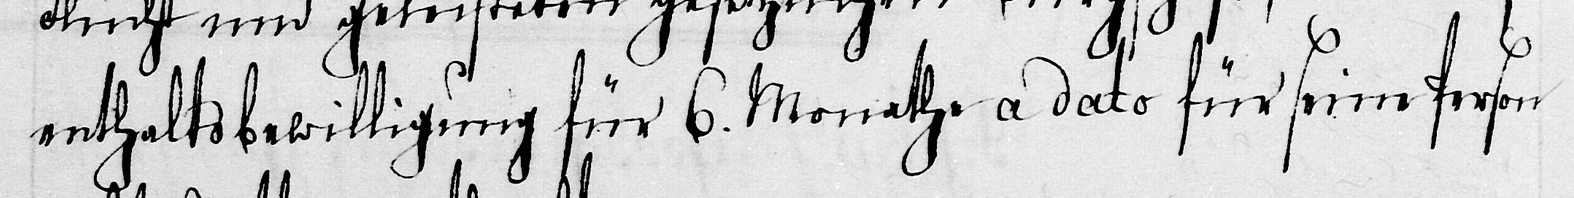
enthaltsbewilligung für 6. Monathe a dato für seine Person
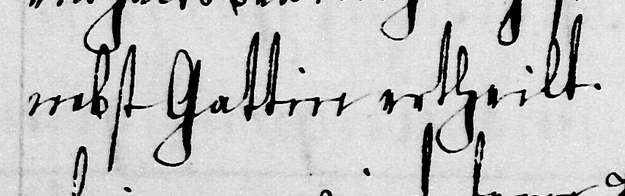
nebst Gattin ertheilt.
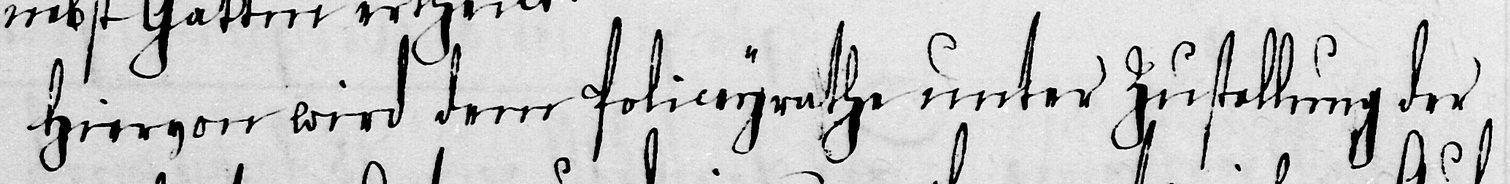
Hiervon wird dem Policeyrathe unter Zustellung der
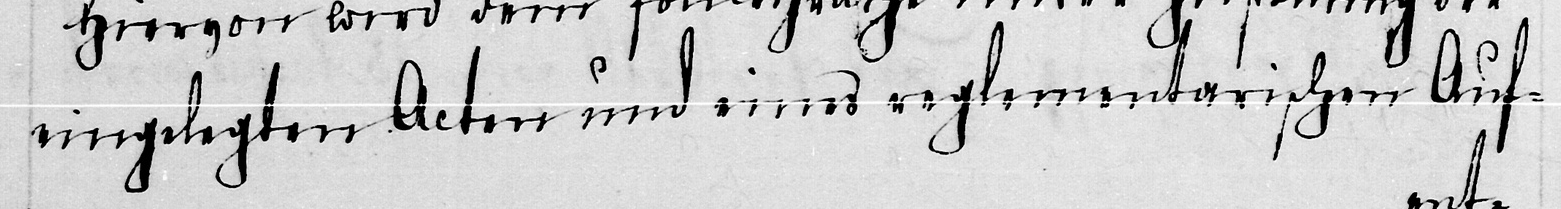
eingelegten Acten und eines reglementarischen Auf-
